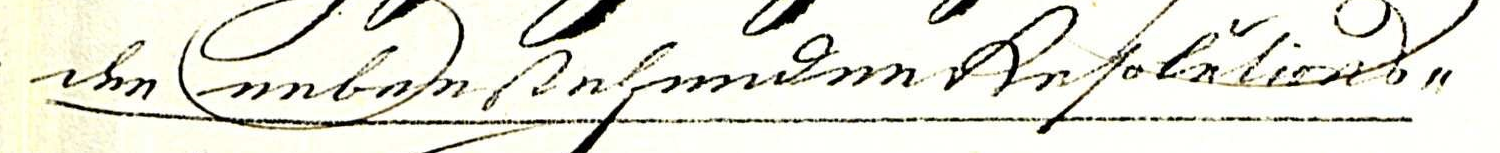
den neben stehenden Resolutions¬
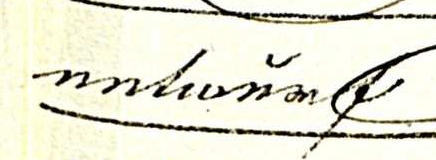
entwurf.
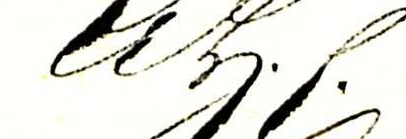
AH E
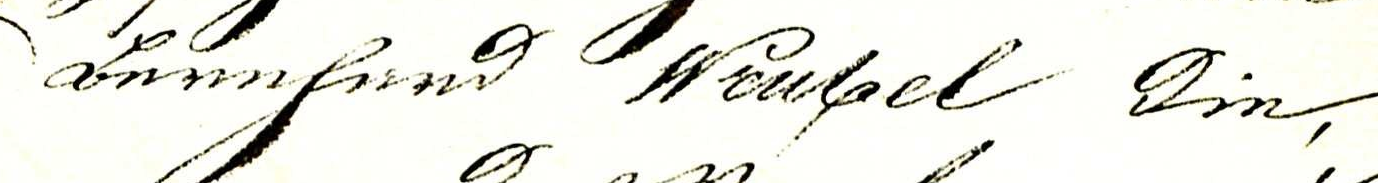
Bernhard Wrubel die,
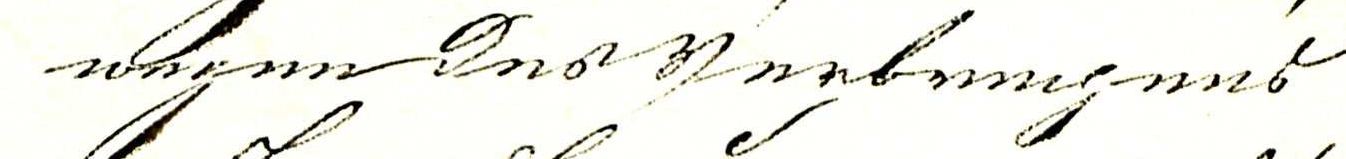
wegen des Verbrechens
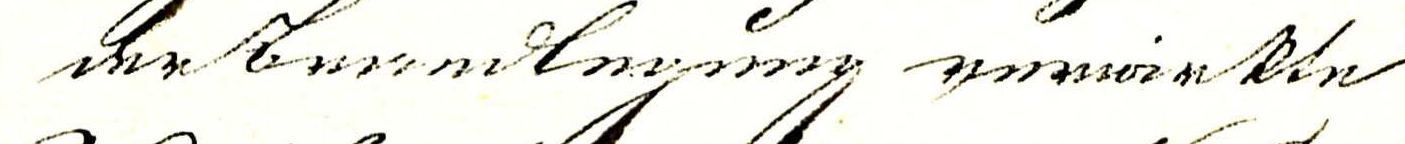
der Brandlegung verwirkte
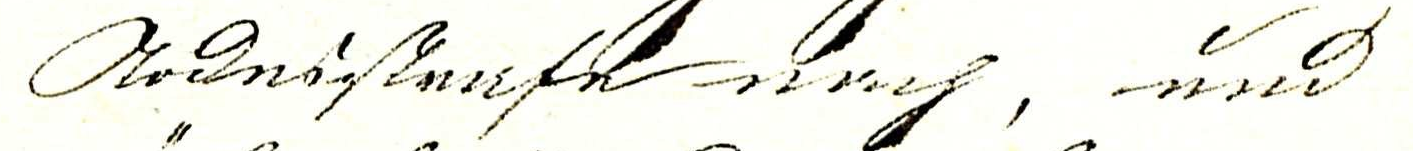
Todesstrafe nach, und
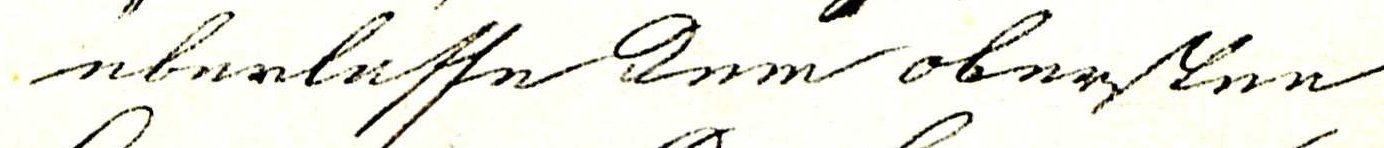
überlasse dem obersten
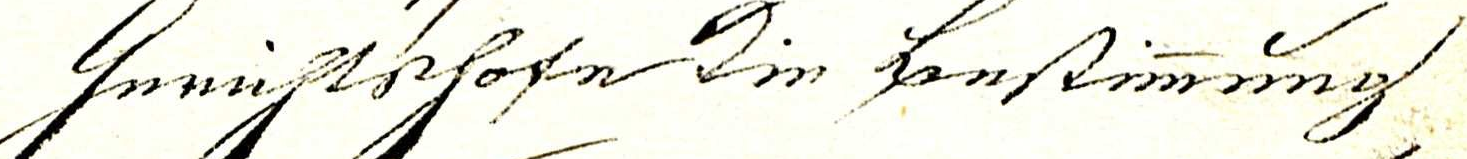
Gerichtshofe die Bestimmung
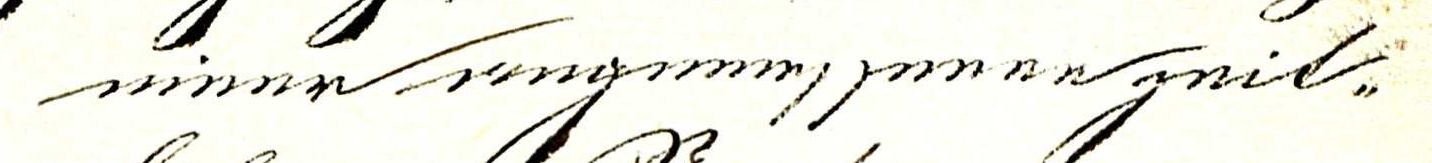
einer angemessenen zeit¬
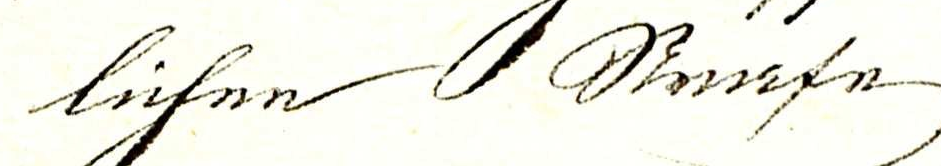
lichen Strafe.
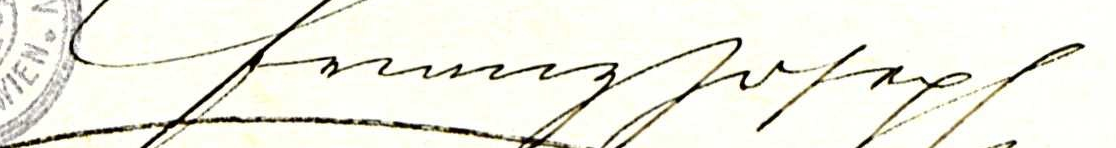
Franz Joseph
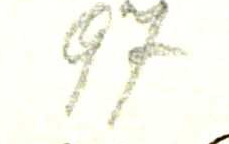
97
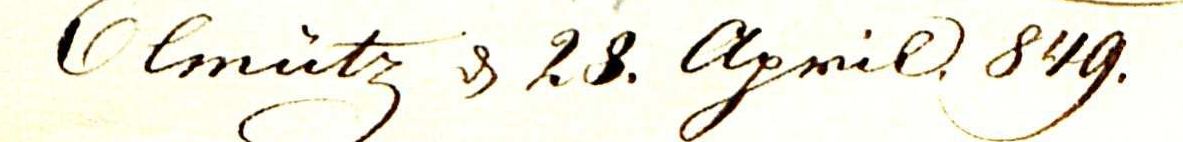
Olmütz d. 28. April 849
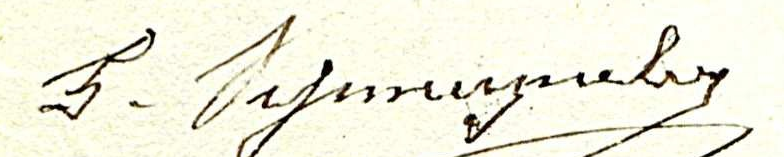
B. Schwarzenberg.
